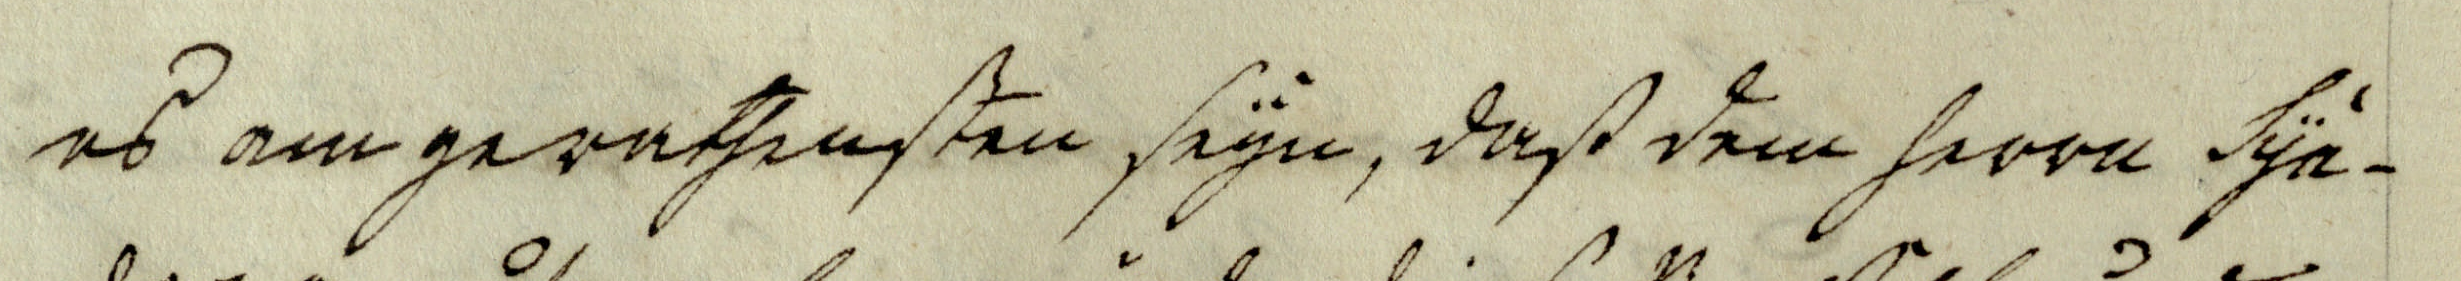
es am gerathensten seÿn, daß dem Herrn Sÿn¬
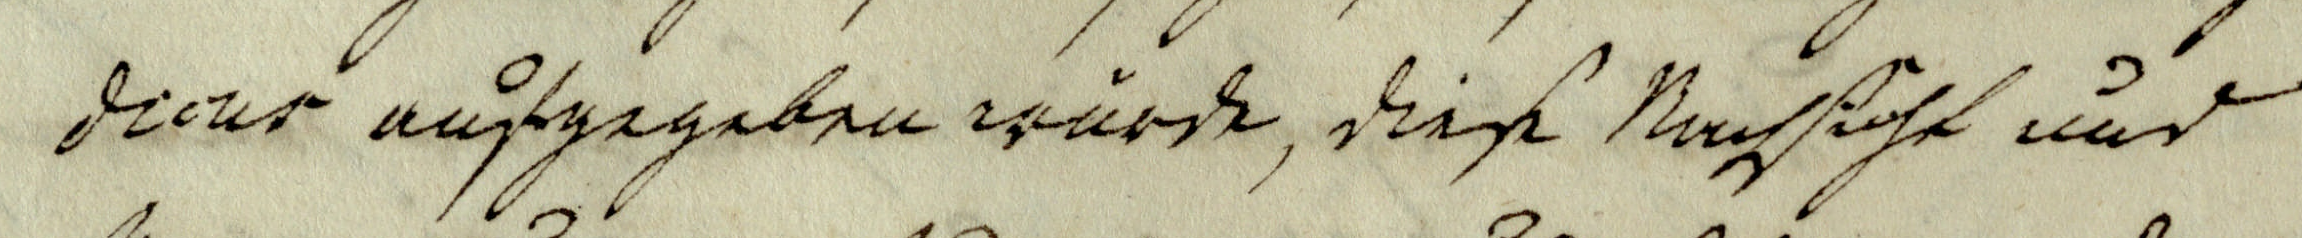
dicus aufgegeben würde, diese Nachsicht und
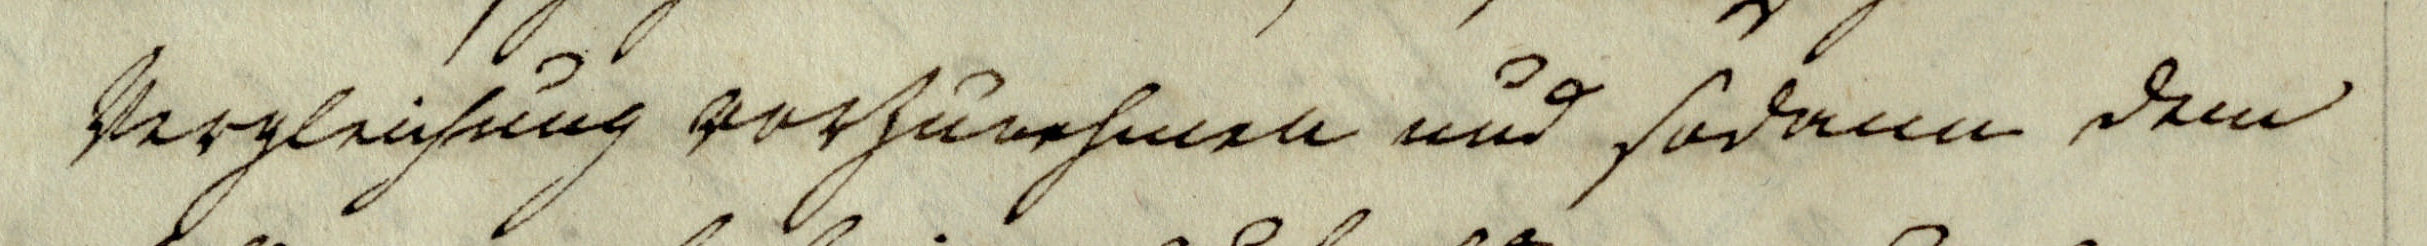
Vergleichung vorzunehmen und sodann dem
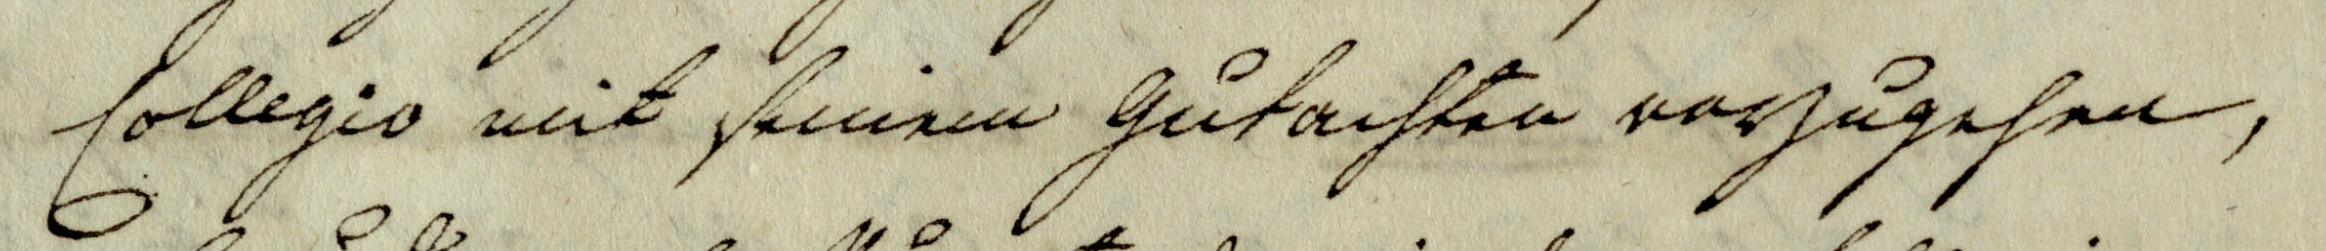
Collegio mit seinem Gutachten vorzugehen,
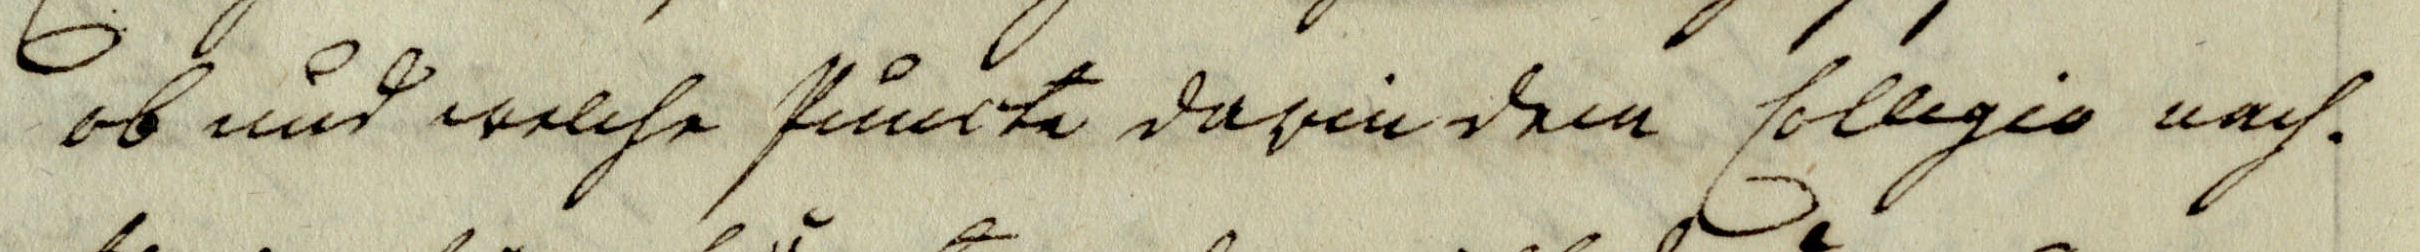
ob und welche Puncte darin dem Collegio nach¬
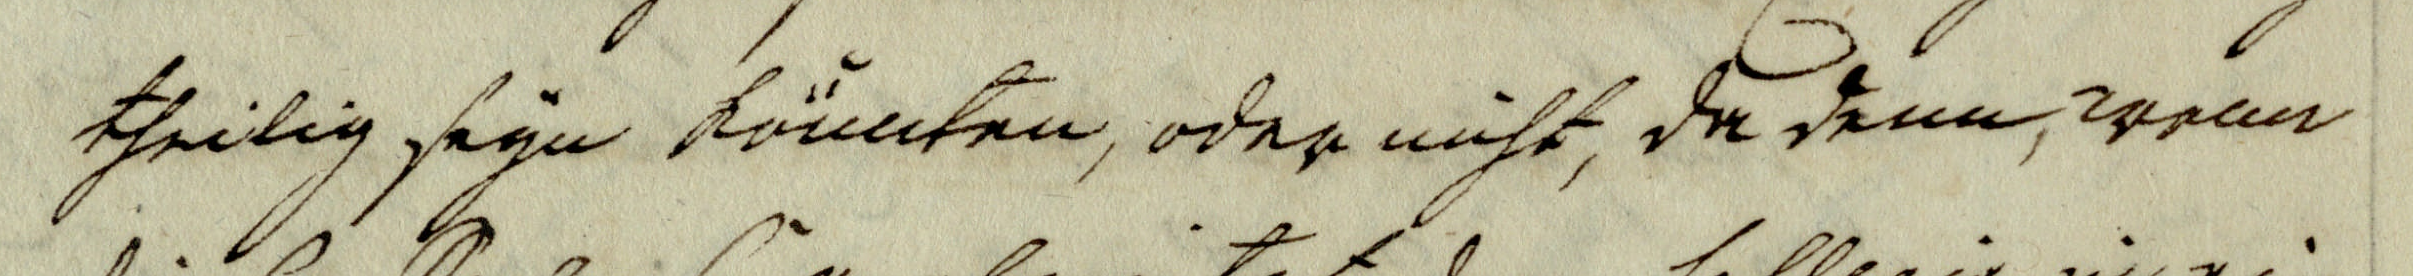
theilig seÿn könnten, oder nicht, da denn, wenn
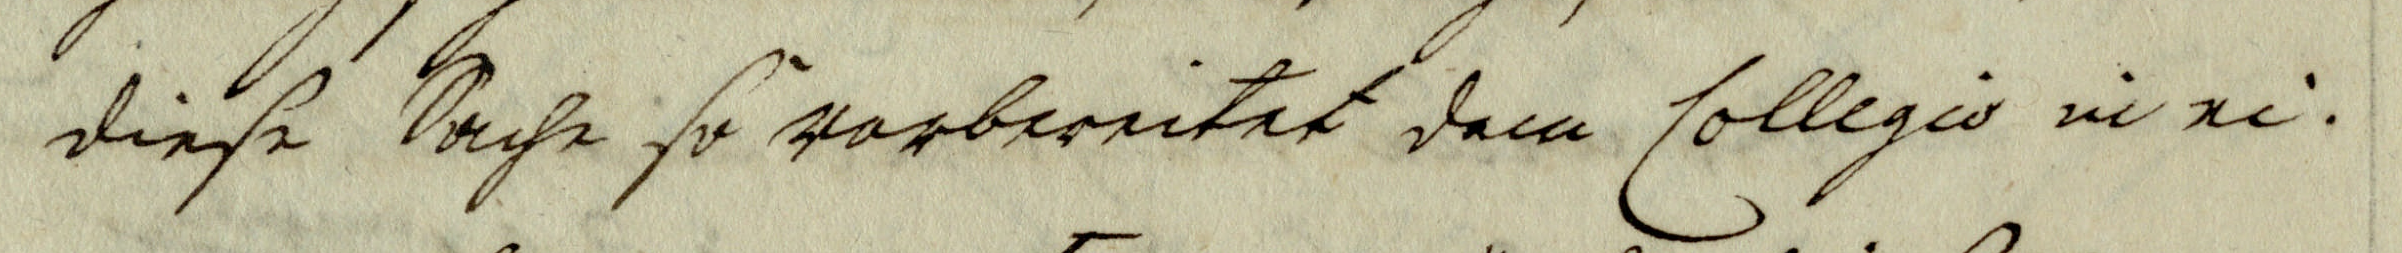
diese Sache so vorbereitet dem Collegio in ei¬
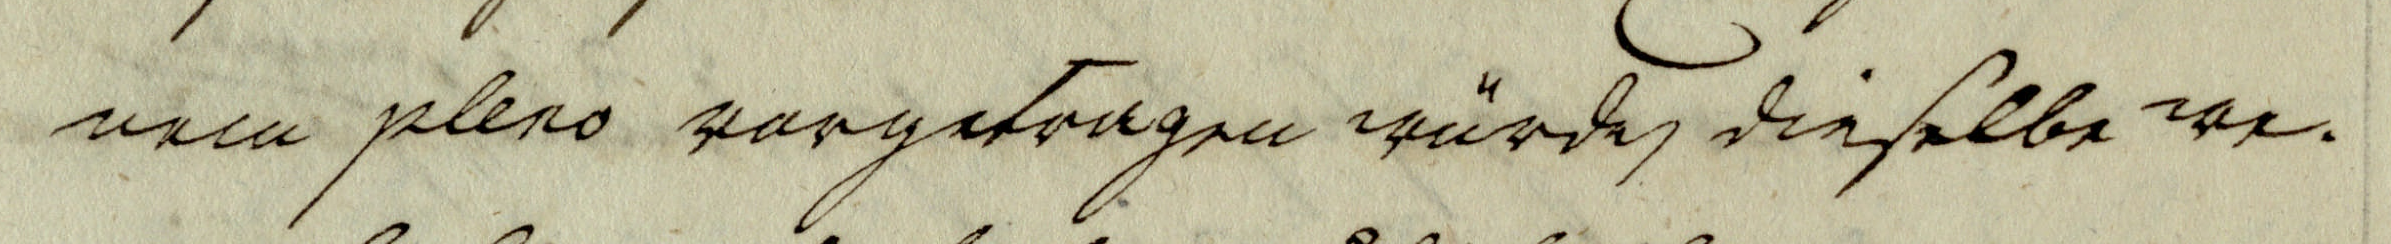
nem pleno vorgetragen würde, dieselbe we¬
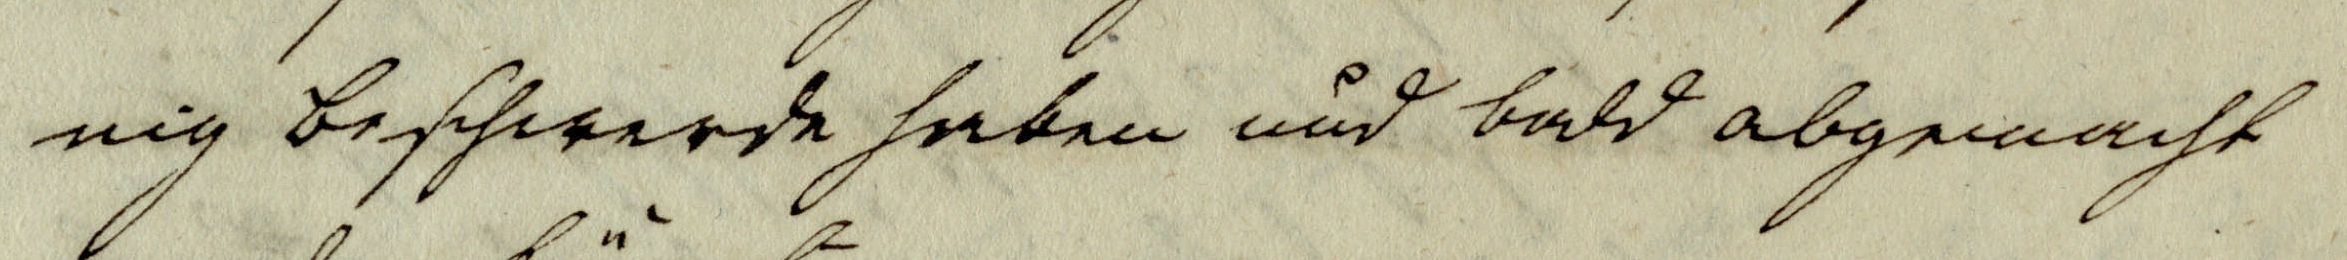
nig Beschwerde haben und bald abgemacht
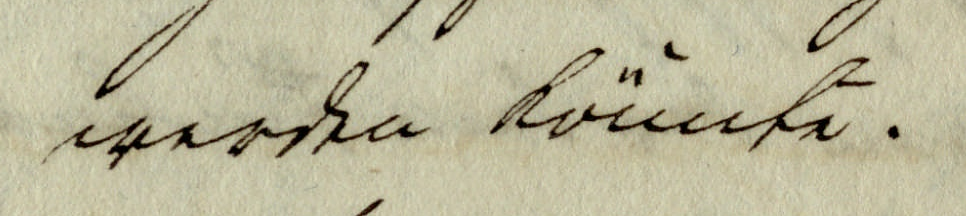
werden könnte.
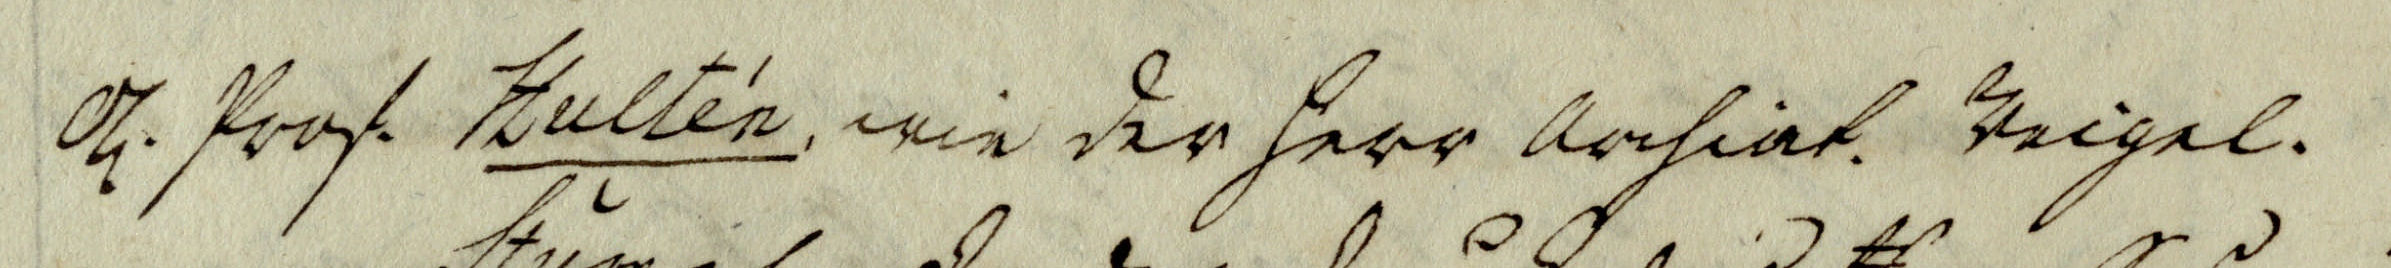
dh. Prof. Hultén, wie der Herr Archiat. Weigel.
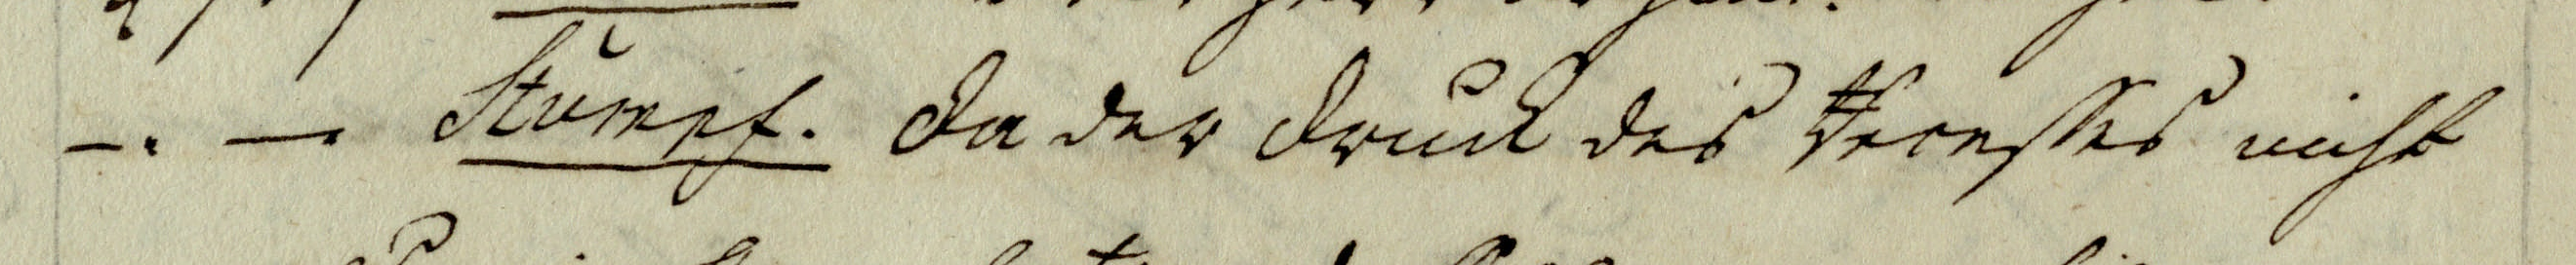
Stumpf. Da der Druck des Recesses nicht
